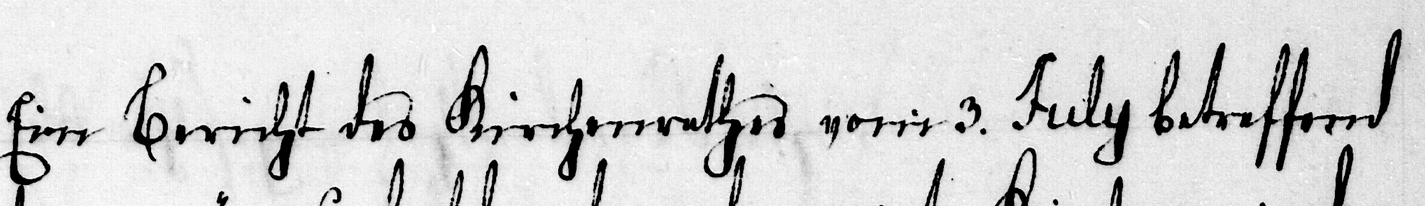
Ein Bericht des Kirchenrathes vom 3. July betreffend
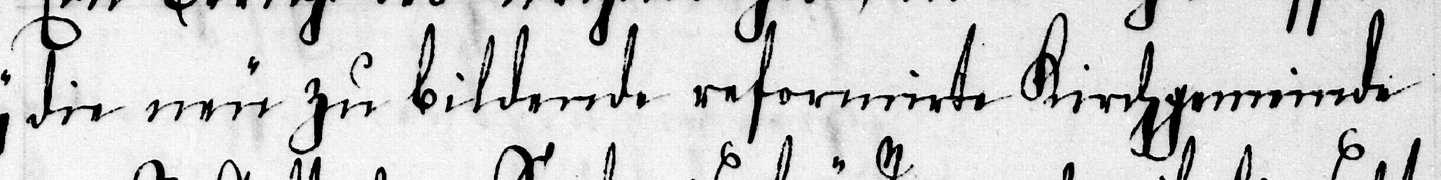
die neu zu bildende reformirte Kirchgemeinde
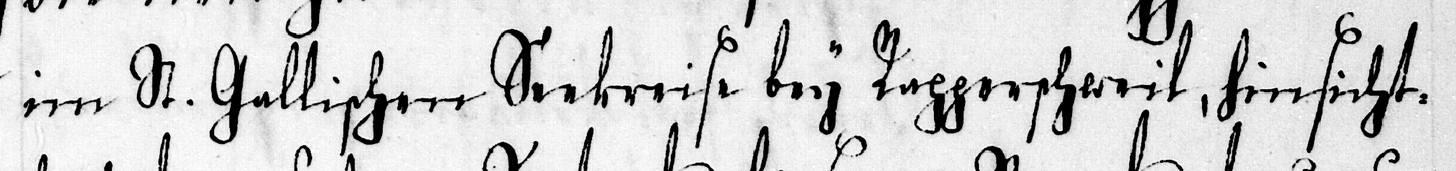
im St. Gallischen Seekreise bey Rapperschweil, hinsicht¬
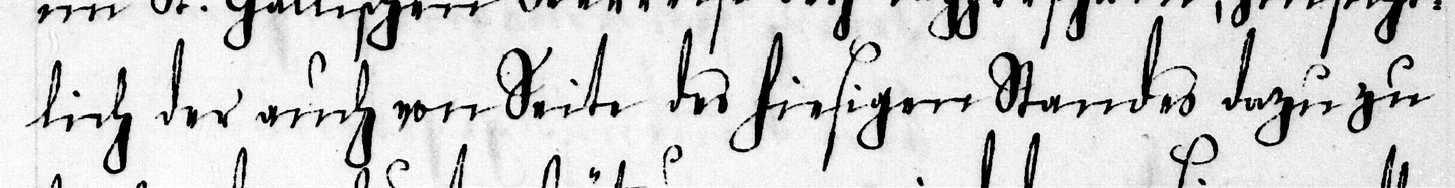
lich der auch von Seite des hiesigen Standes dazu zu
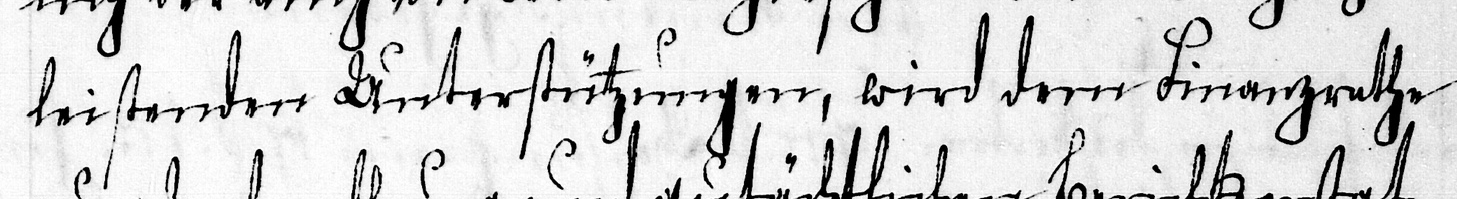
leistenden Unterstützungen, wird dem Finanzrathe
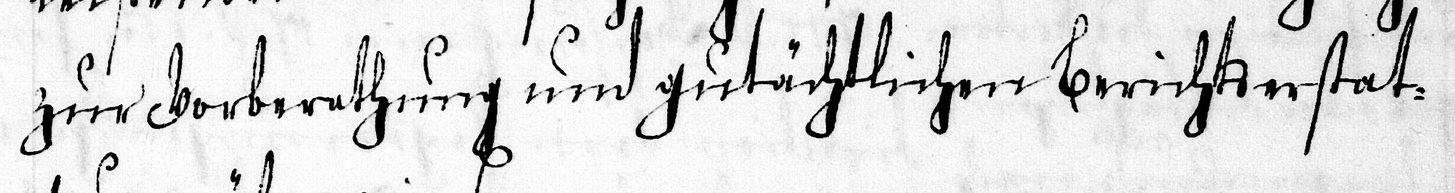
zur Vorberathung und gutächtlichen Berichtserstat¬
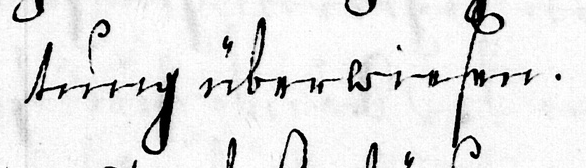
tung überwiesen.
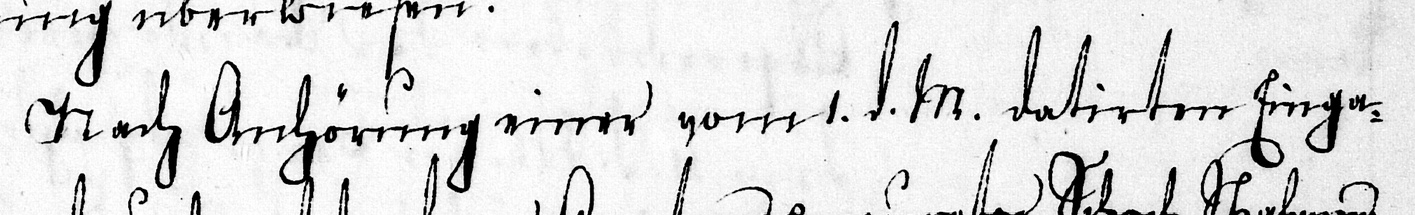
Nach Anhörung einer vom 1. d. M. datirten Einga¬
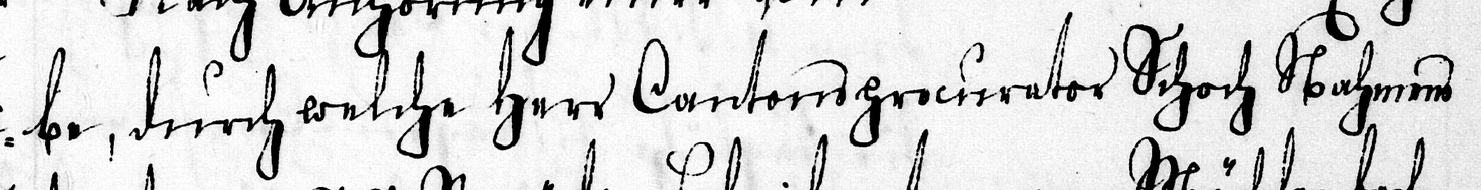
be, durch welche Herr Cantonsprocurator Schoch Nahmens
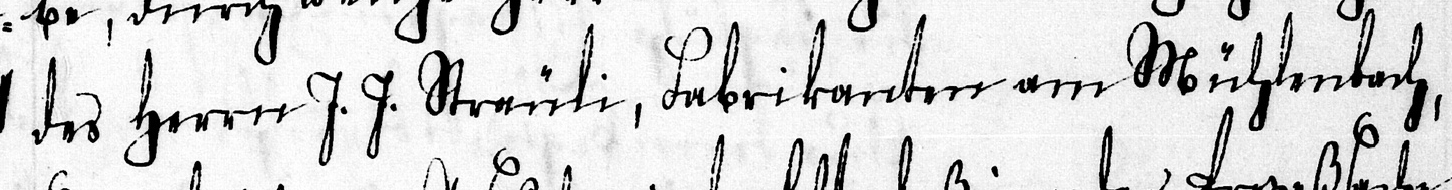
des Herrn J. J. Sträuli, Fabrikanten am Mühlenbach,
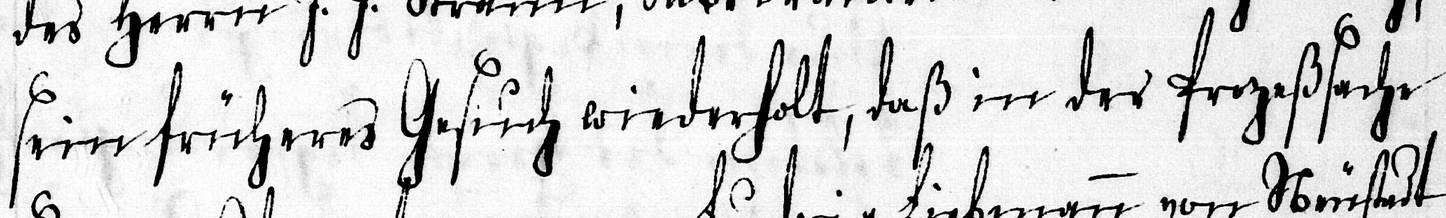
sein früheres Gesuch wiederholt, daß in der Prozeßsache
